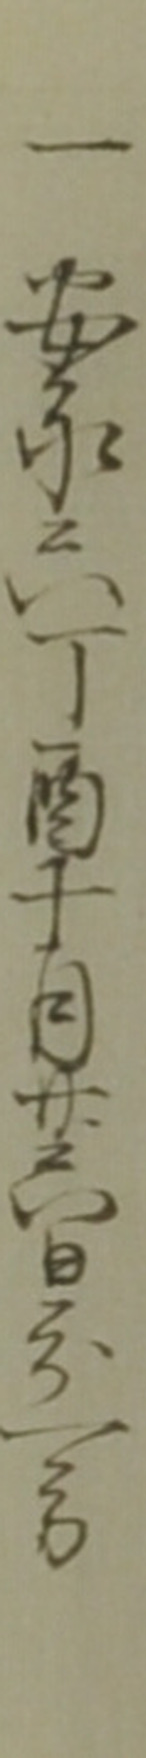一安永六丁ｔ酉十月廿六日分一方
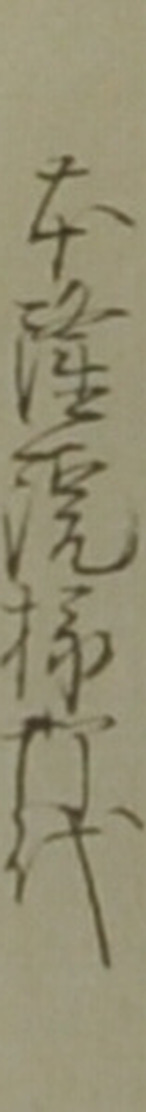本隆院様御代
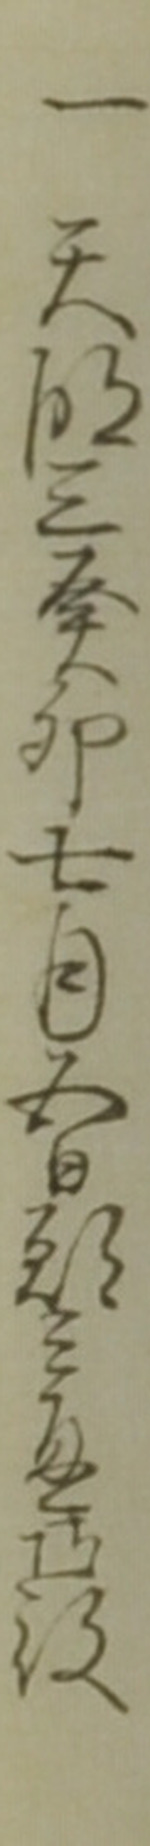一天明三癸卯七月五日願之通御役

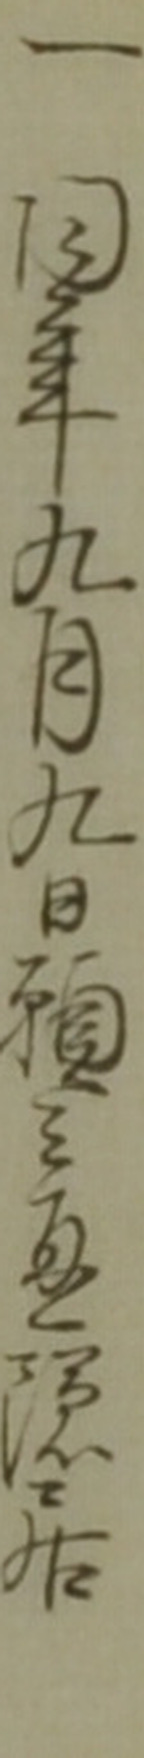一同年九月九日願之通隠居
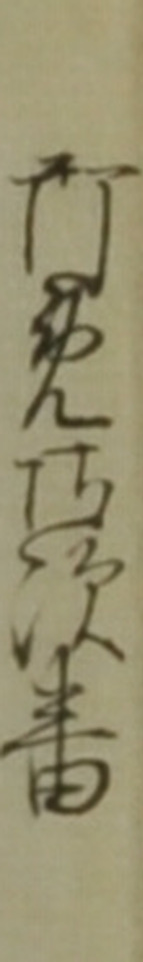御免御次番
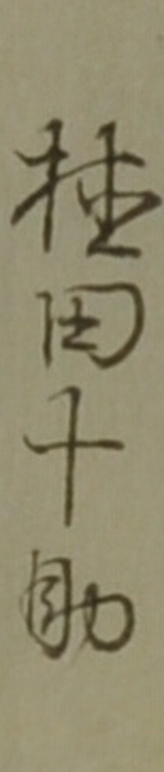植田十助
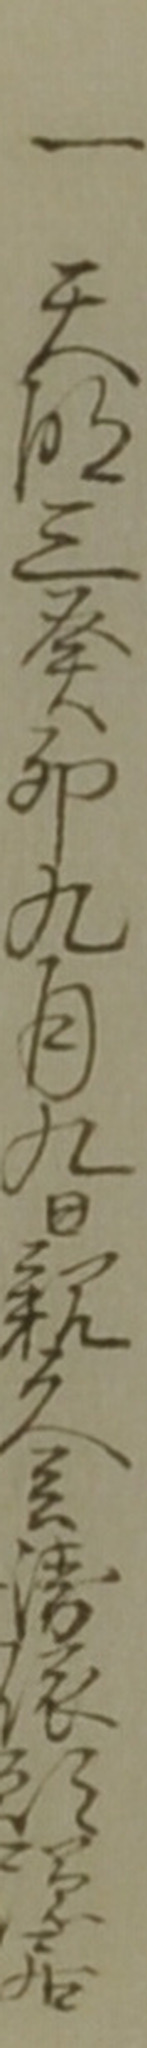一天明三癸卯九月九日親久兵衛依願隠居
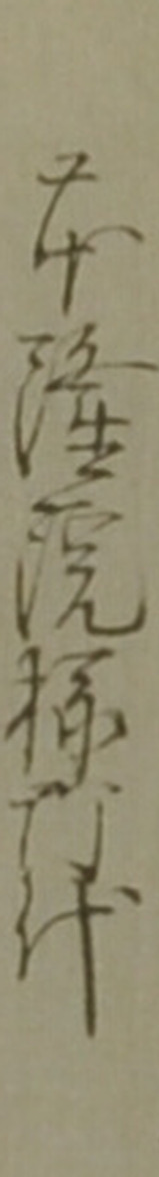本隆院様御代
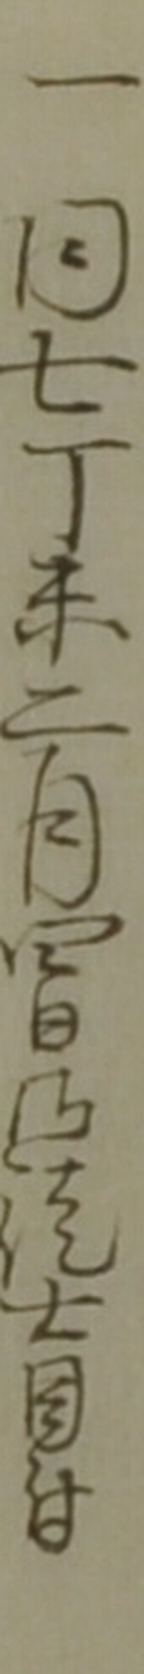一同七丁未二月四日御徒士目付
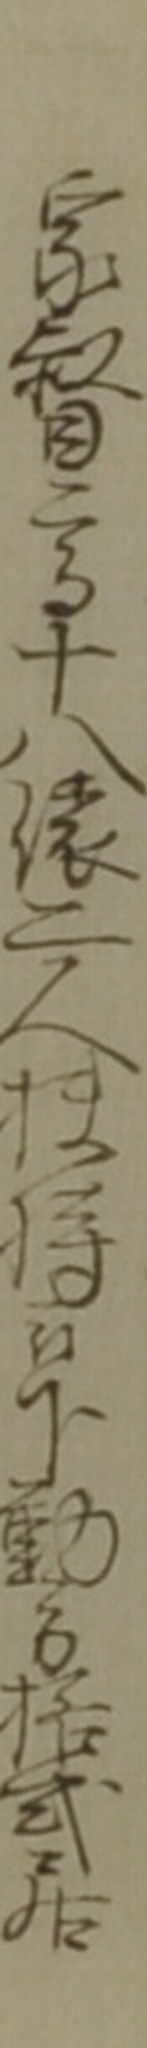家督高十八俵二人扶持被下勤方格式居
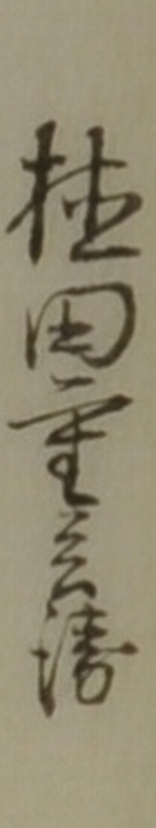植田重兵衛
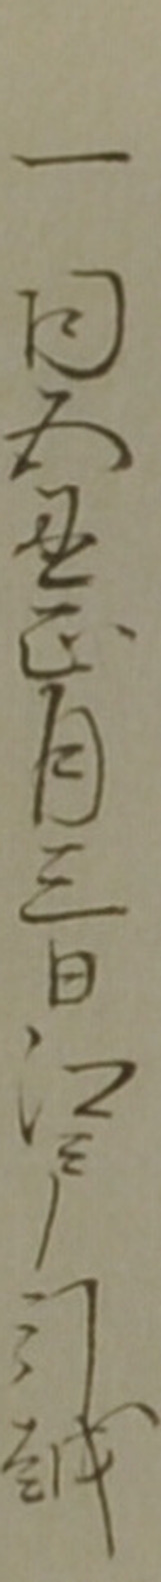一同五丑正月三日江戸引越
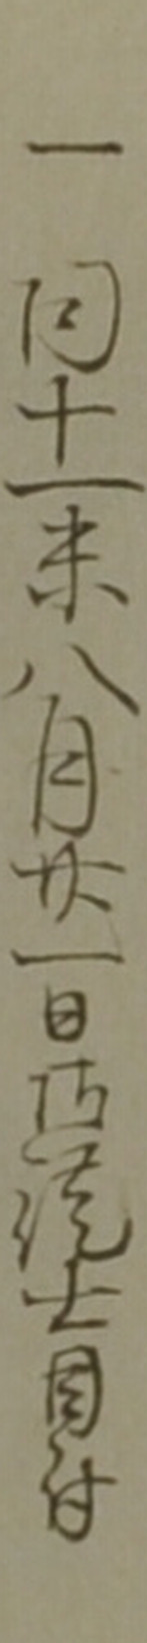一同十一未八月廿一日御徒士目付
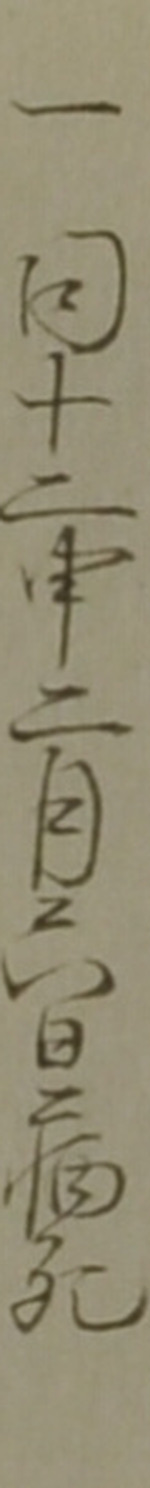一同十二申二月六日病死
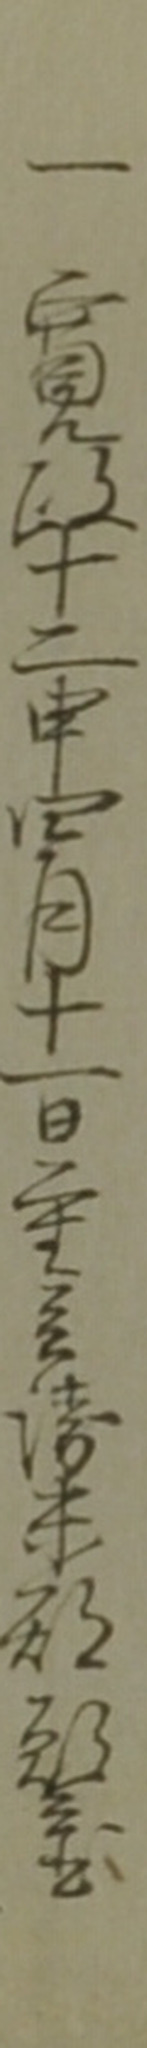一寛政十二申四月十一日重兵衛末期願置
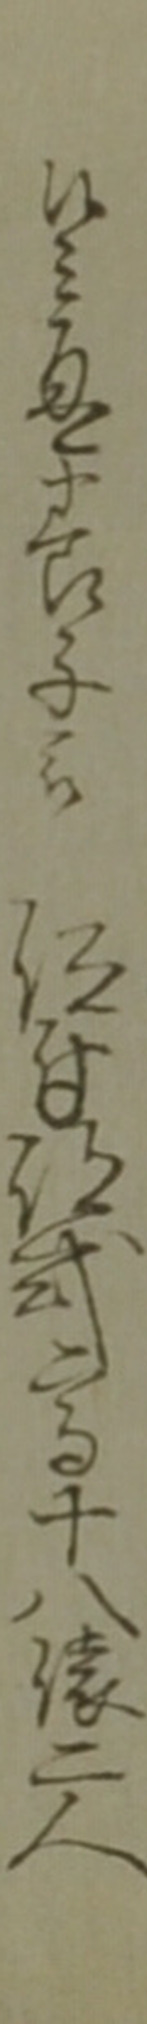候之通養子被仰付跡式高十八俵二人
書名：無足廃家（壱）
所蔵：伊那市立高遠町図書館・合同会社AMANE
